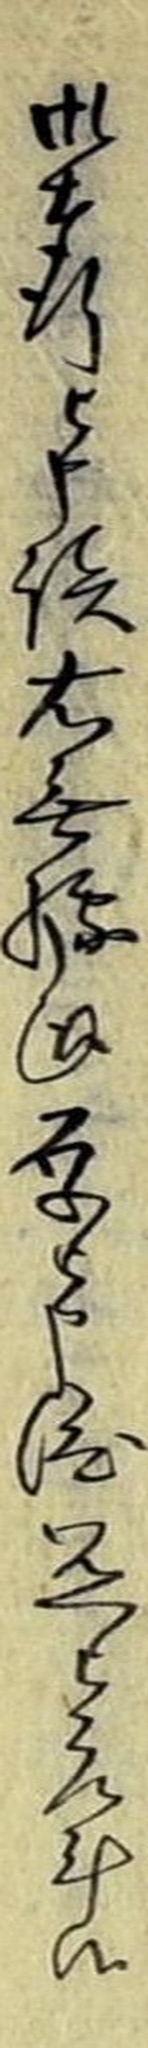御奉行被申談右無拠趣厚被申渡宜被取斗候
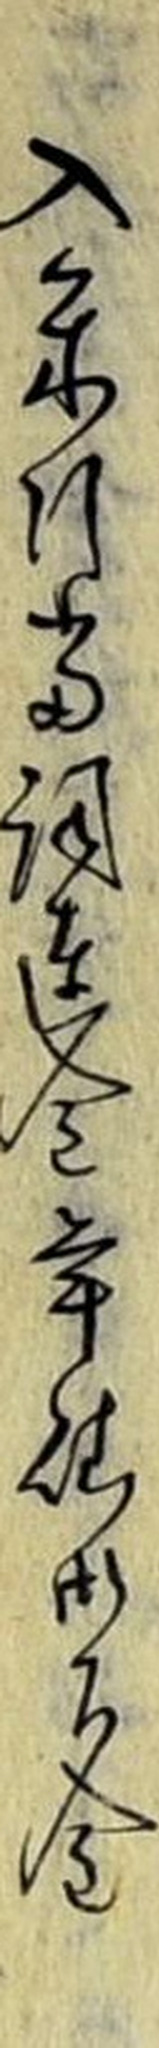入米引当調達金年賦御下金
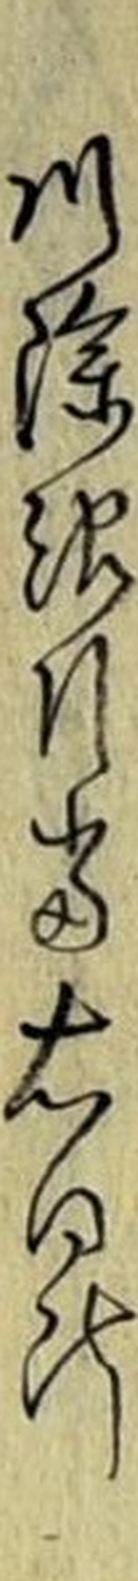川除銀引当右同断
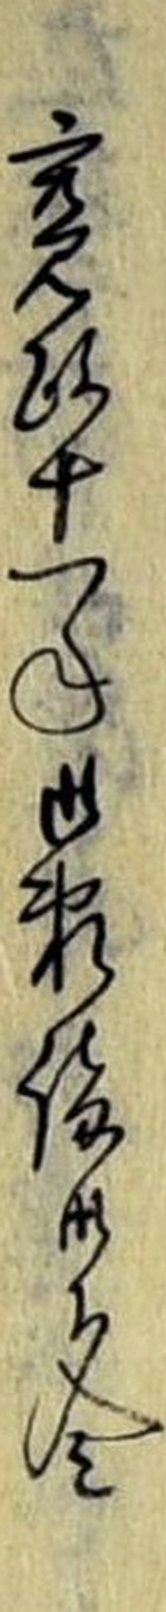寛政十一年御頼講御下金

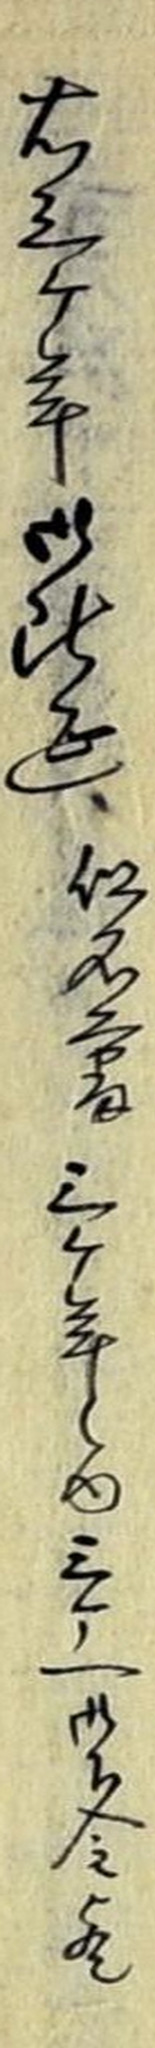右三ヶ年御断延候但不審三ヶ年之内三ヶ一御下金歟
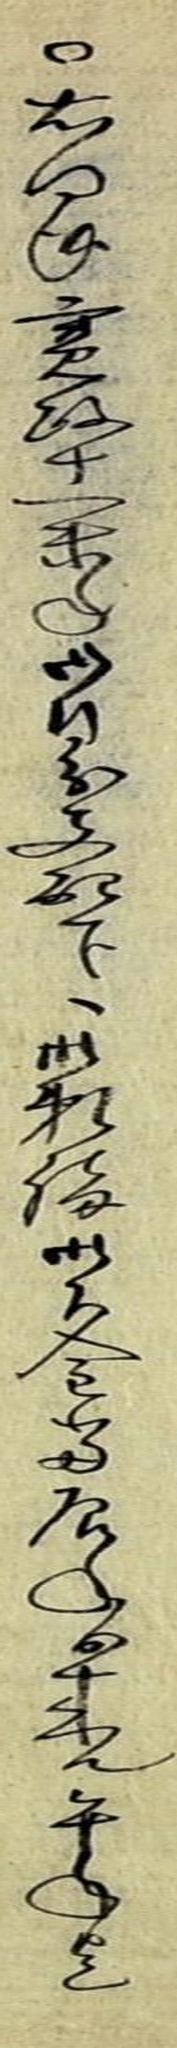○右同趣寛政十一未年御自分支配下へ御頼講御下金当辰年ゟ来ル午年迄
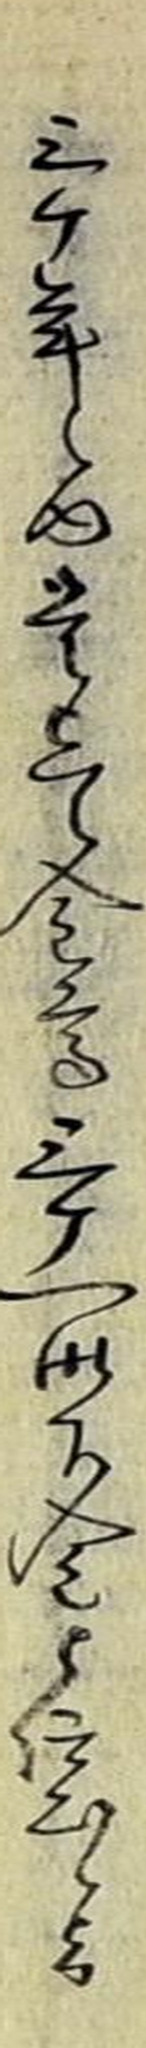三ヶ年之内是迄之金高三ヶ一御下金被仰出候旨
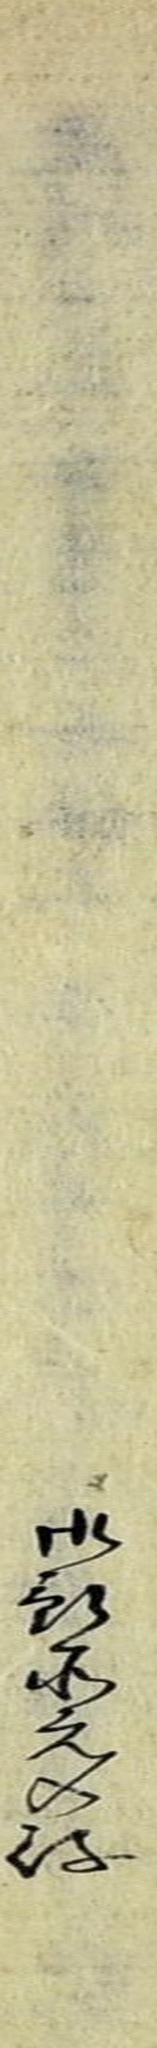御預所元〆役
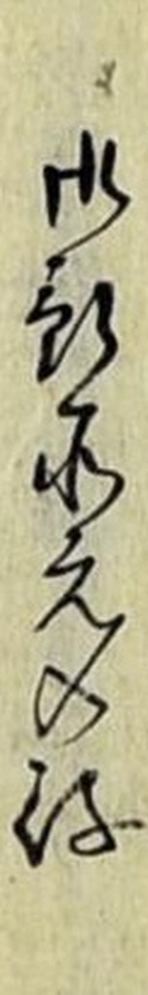御預所元〆役
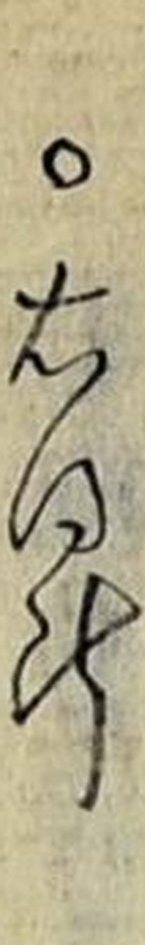○右同断
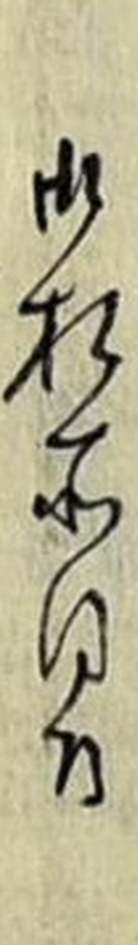御札所目付
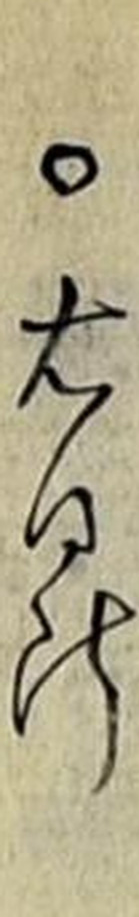○右同断
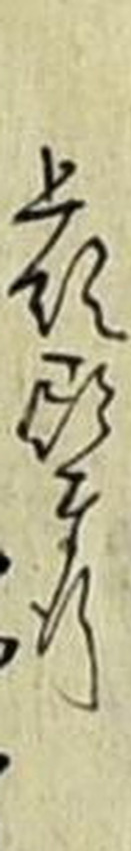上領郡奉行
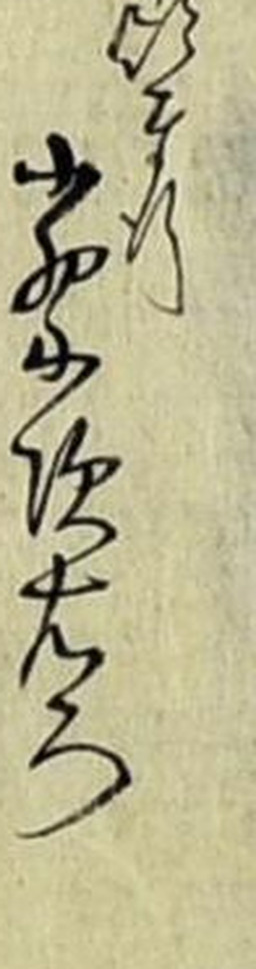小栗次右衛門
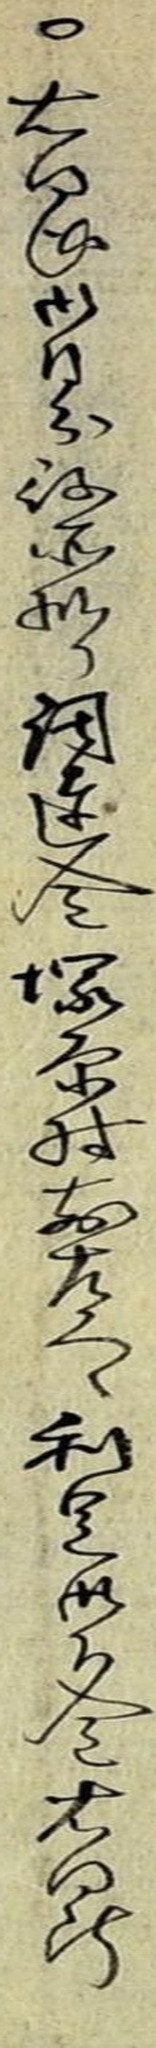○右同趣御自分役所掛り調達金塚原村前左衛門へ利息御下金右同断
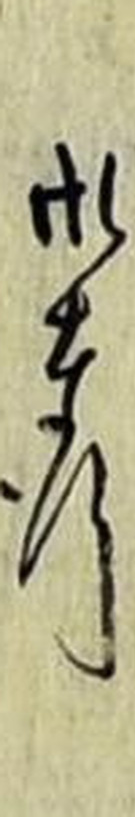御奉行
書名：命令之部 四
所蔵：福井県文書館 Fukui Prefectural Archives
